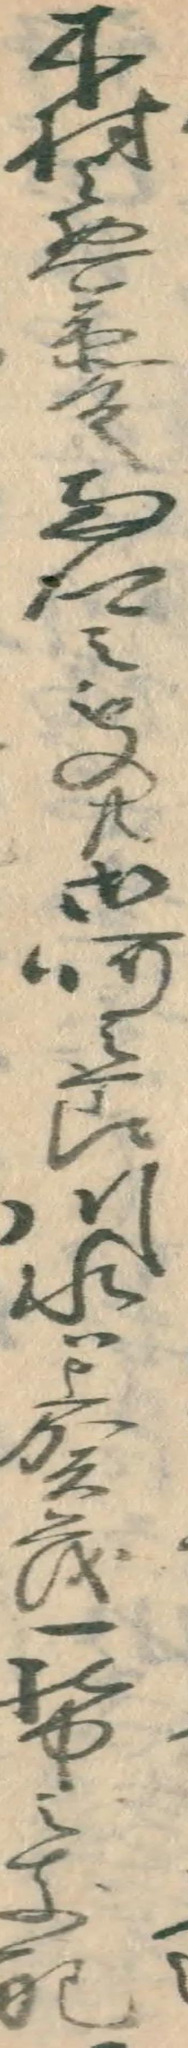木村之惣兵衛殿両郷之もの共御呵之節川水は上賀茂一社中之支配ニ
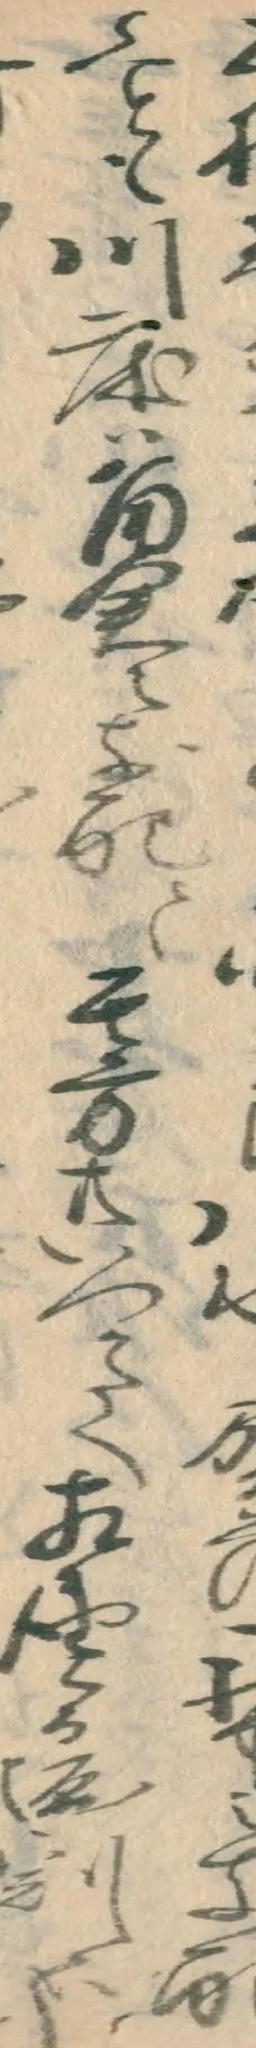候へとも川床ハ角倉之支配ニ候其方共いつかへ相届候而掘割候哉と
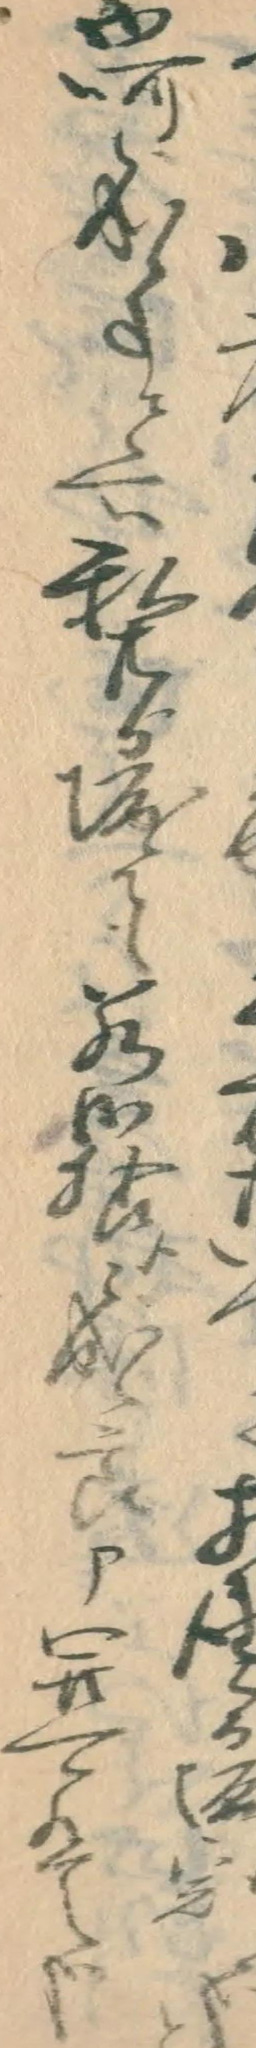御呵被成候事ニ候へハ私共ゟ掘候ても若御咎メ被成候節申開可有之哉

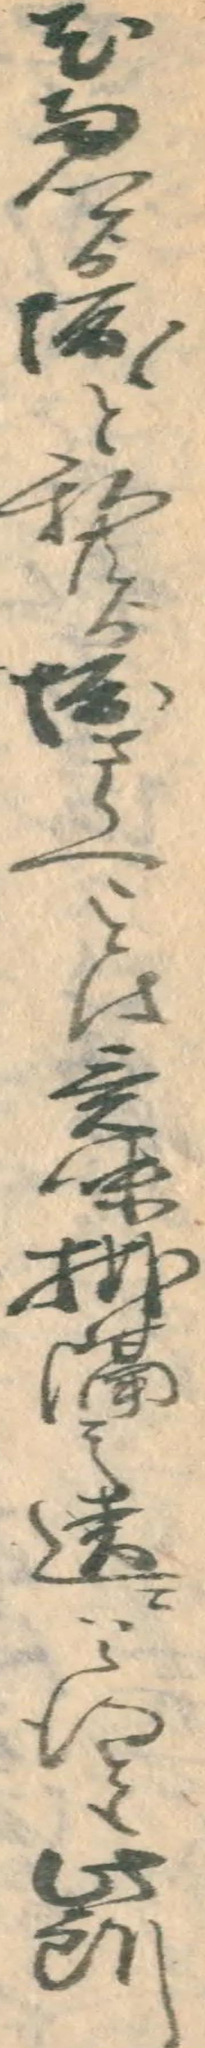尤両郷ゟ掘候と私共ゟ掘さらへ候とは意味掛隔之違ニハ候得とも此所
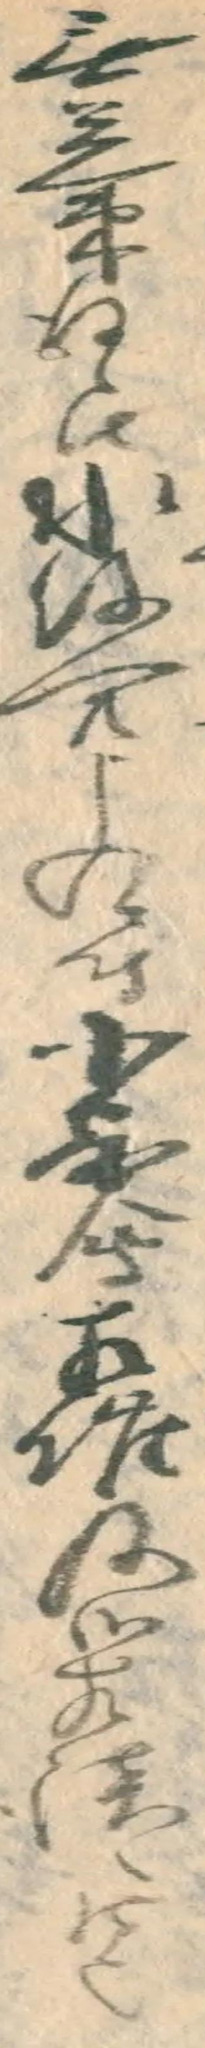無覚束存候由水役人共申入ニ付小寄会相催及御相談候由也
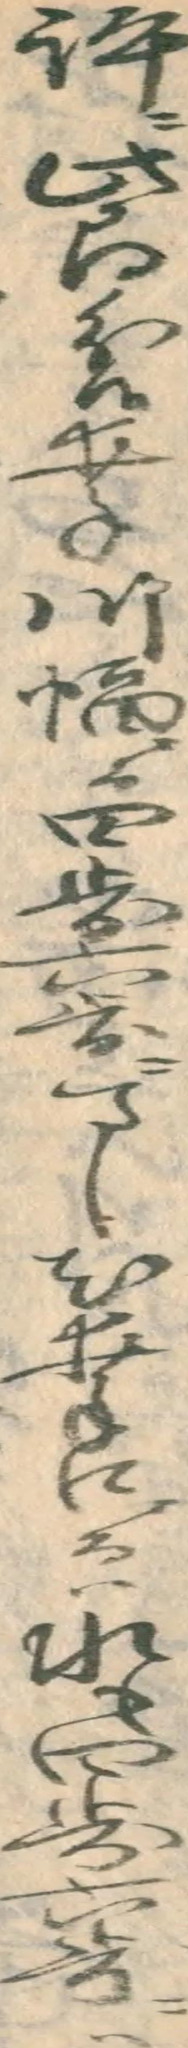評ニ此間分候井手川幅ニ而四歩六歩ニいたし尤井手口ニ而ハ水も四歩六歩ニハ
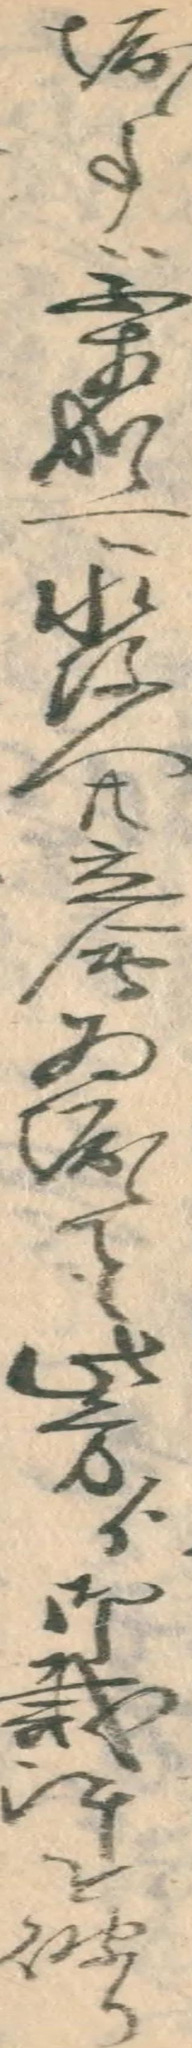堀候事ハ不相成候へハ水役人共立会為堀候ても此方ゟ御裁許を破り
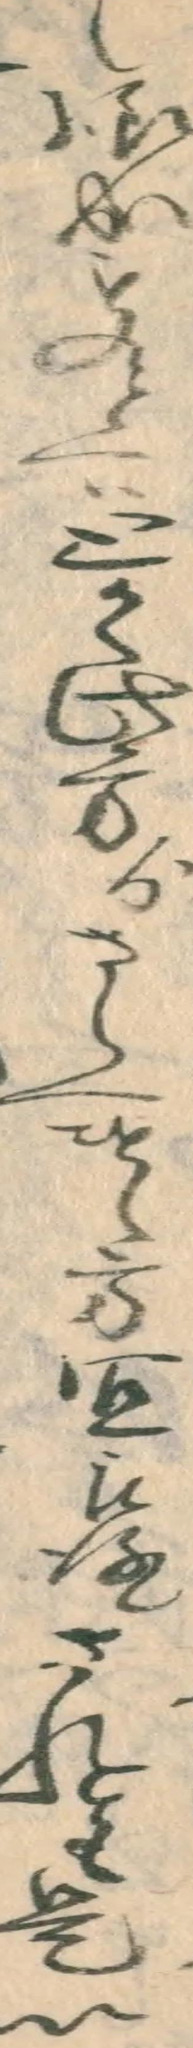申候様成ものニ候ヘハとかく此方ゟさらへ遣候方宜被存候されとも是以
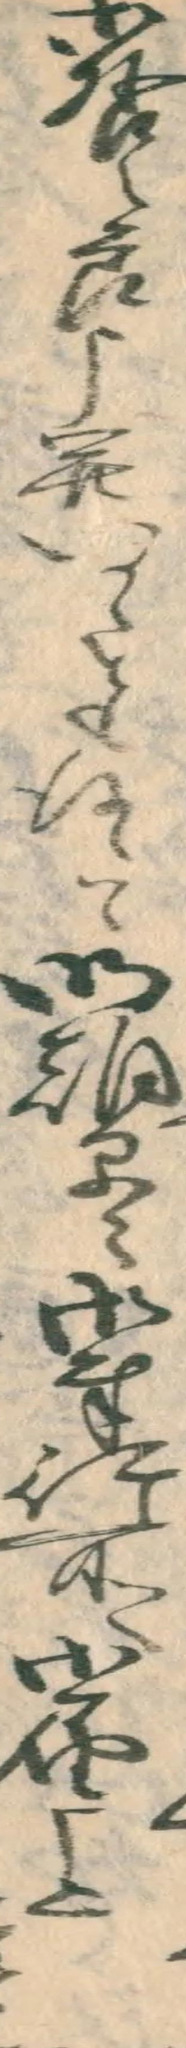御咎之節申開いかゝとも存候ハヽ明朝早々御奉行所へ御届申上其上ニ而
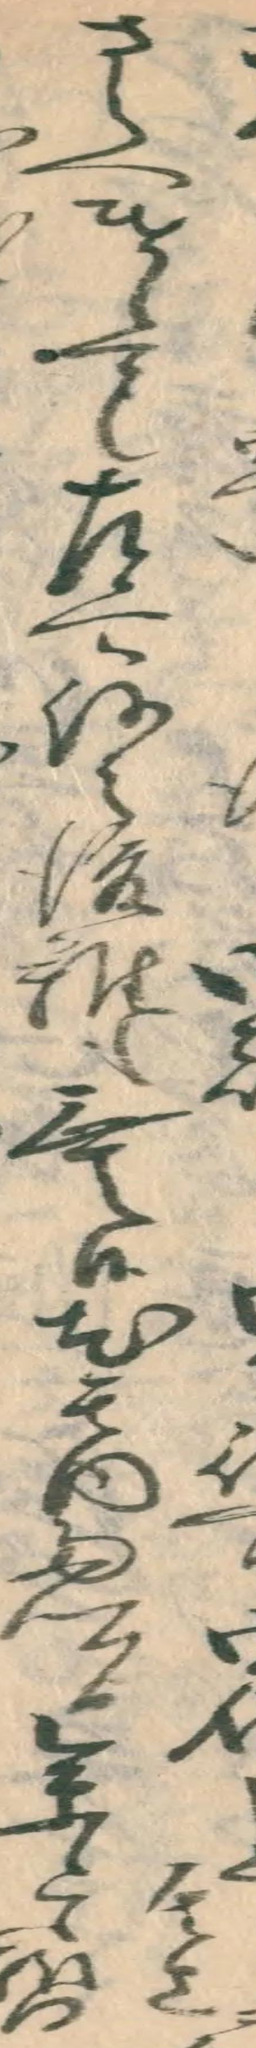さらへ遣し可申候左候へハ何之後難も無之候尤其内両郷ゟ参候ハヽ暫
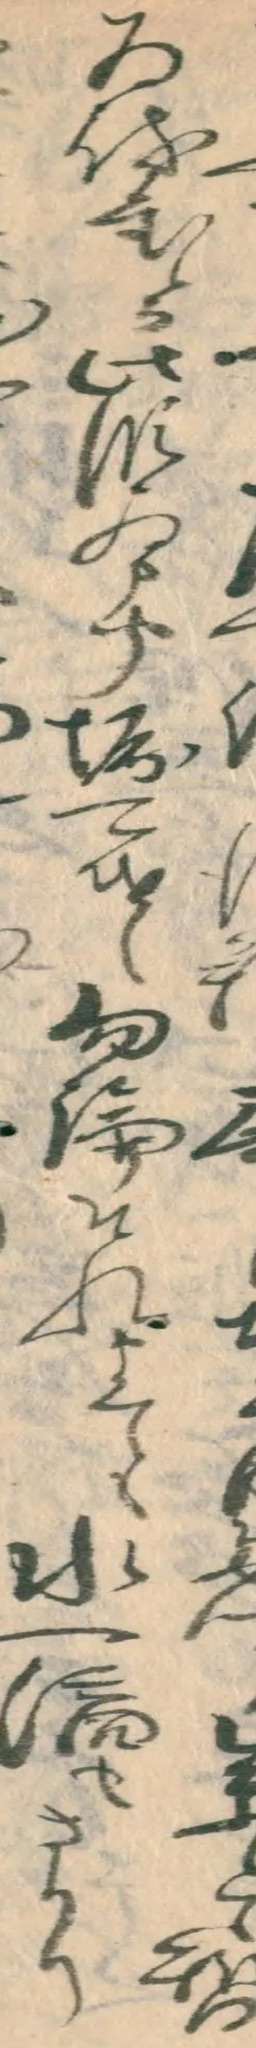為待置候而此段為申聞掘可遣候勿論それまても水一滴もさかり
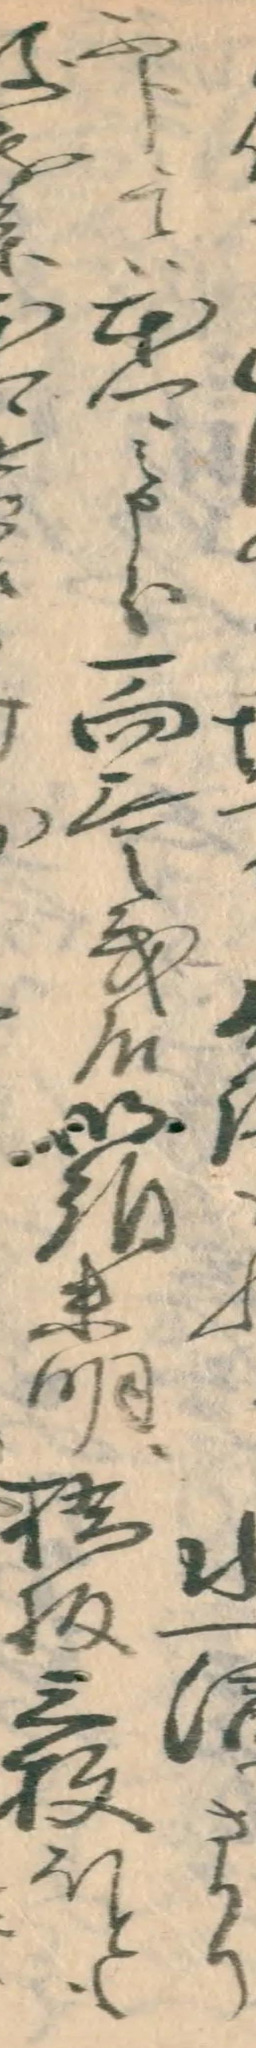不申候てハ本郷之申分一向無之義故明朝末明ニ橋板三枚ほとも
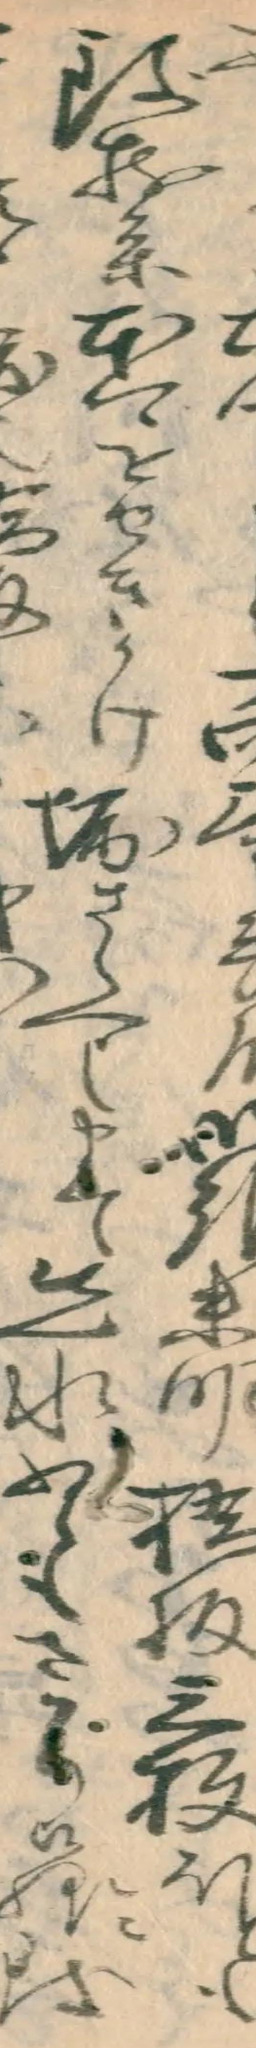致持参本郷をせきかけ堀さらへ申候申上候先水少々もさかり候様ニ致
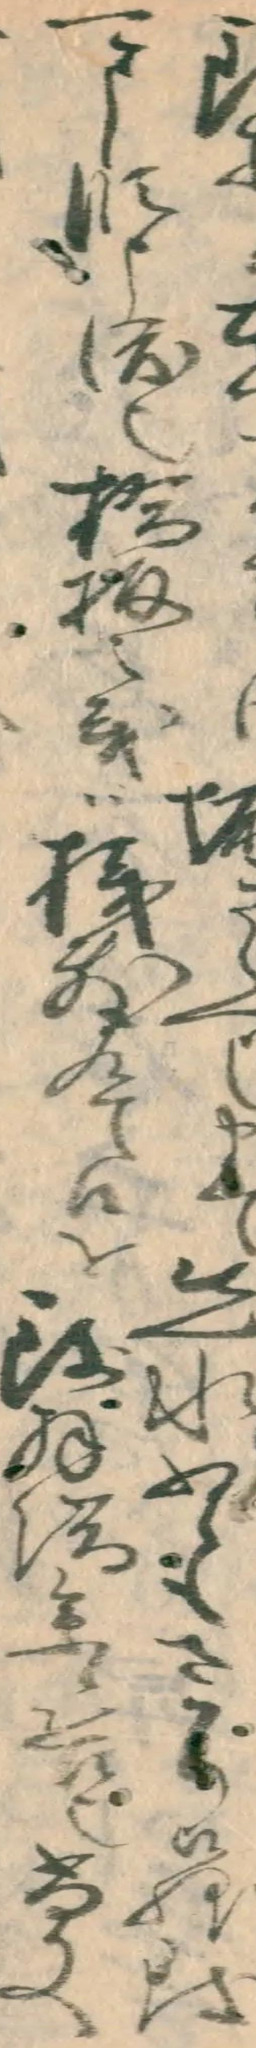可申段申渡也橋板之義ハ桟敷有之候を致拝借参候筈也尚又
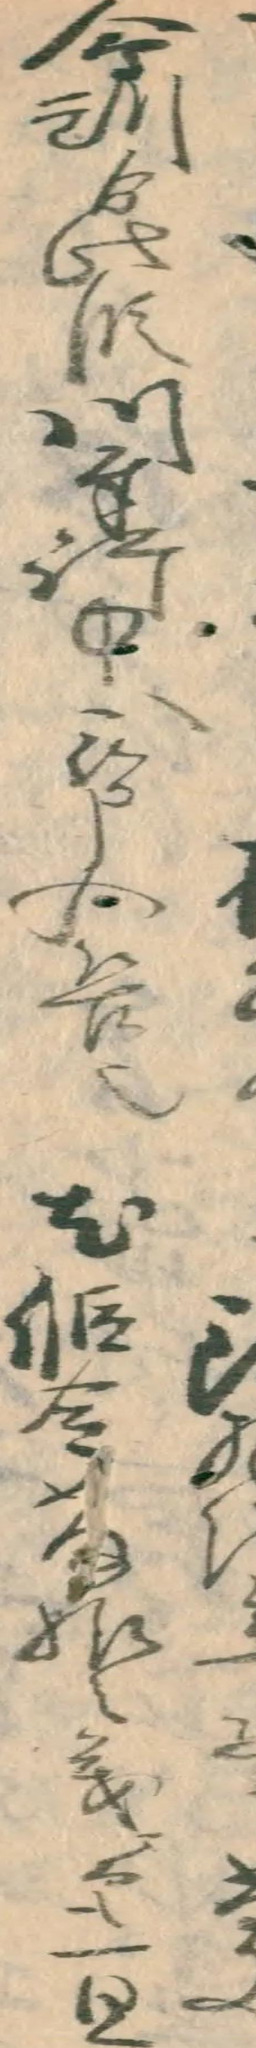会所ゟ此段川奉行中へ被申入候筈也尤仮令如何様之義ニ而も一旦
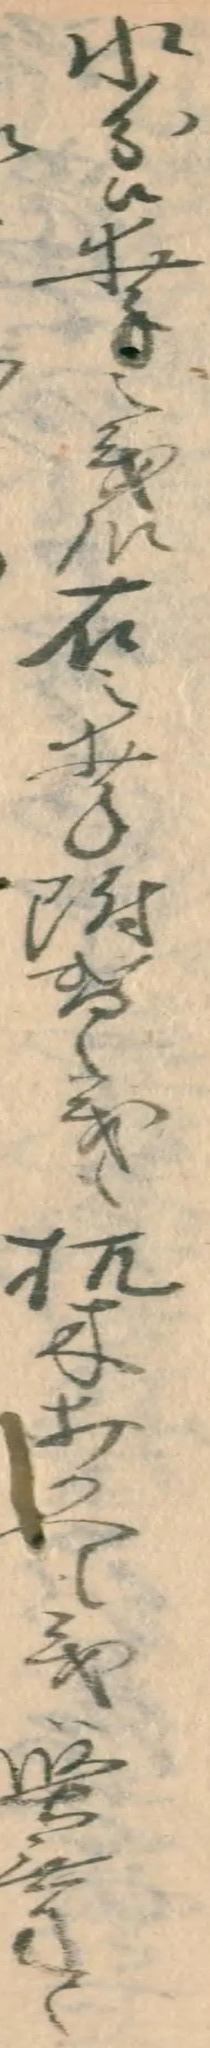水分候井手之義故右之井手付替之義候も杭木打かへ申候義ハ堅無用と
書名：賀茂社記録. 第58冊
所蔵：国立国会図書館 National Diet Library, JAPAN
